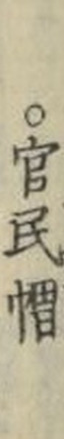◦官民帽
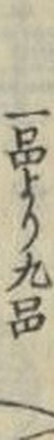一品より九品前
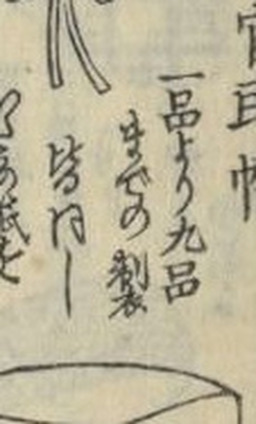までの製
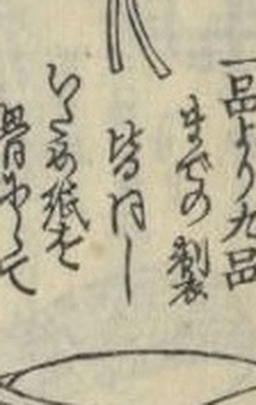皆同し
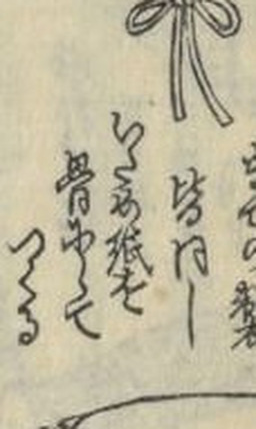いため紙を
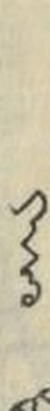つくる
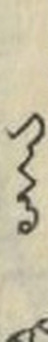つくる
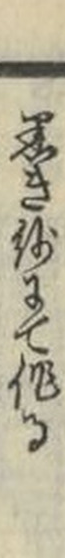黒き紗にて作る
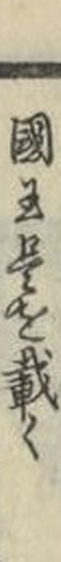国王是を載く
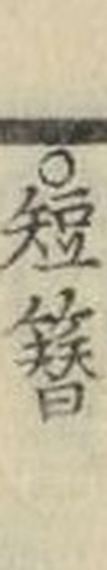◦短簪
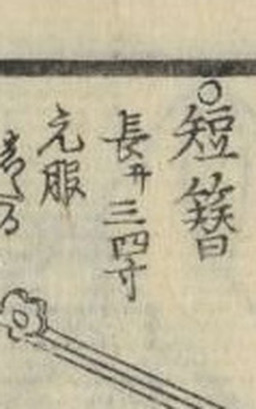長サ三四寸
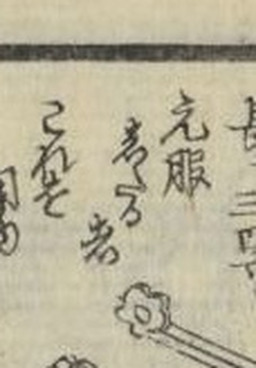したる
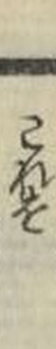これを
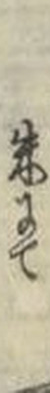朱にて
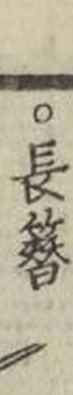◦長簪
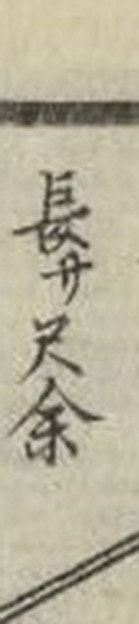長サ尺余
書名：琉球解語
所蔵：University of the Ryukyus Library
